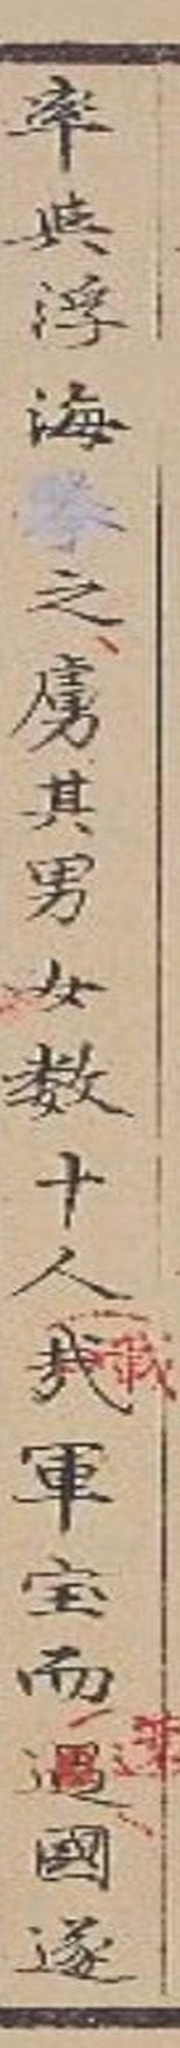率与浮海挙之、虜其男女数十人哉載軍宝而遇還、国遂
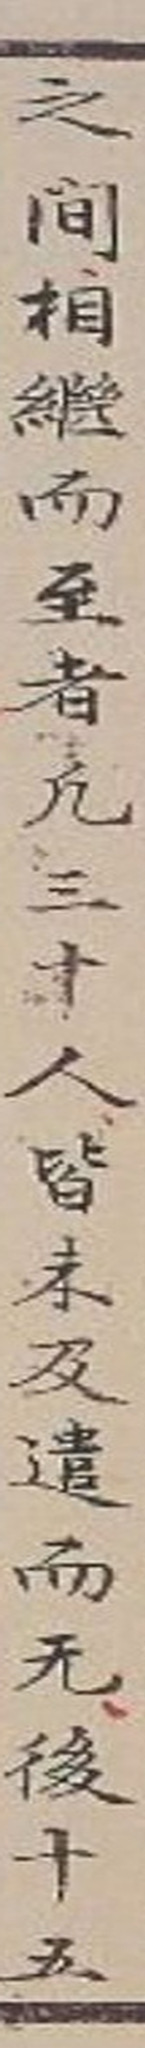之間、相継而至者凡三十人、皆未及遣而无、後十五
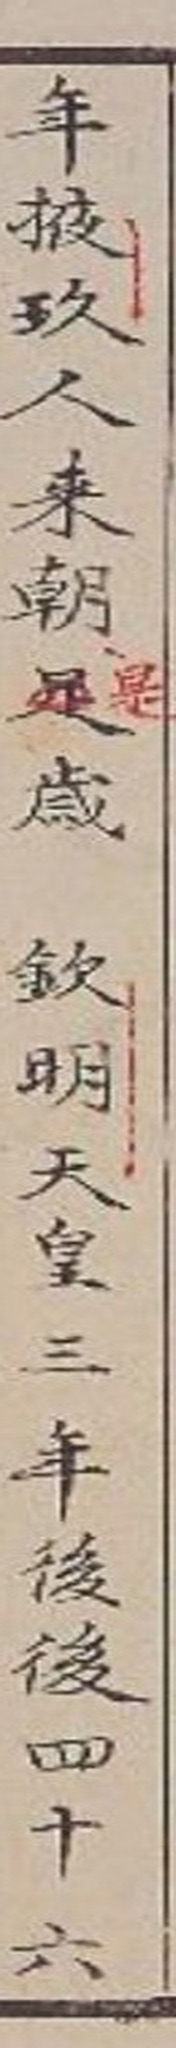年掖玖人来朝、足是歳欽明天皇三年後後四十六
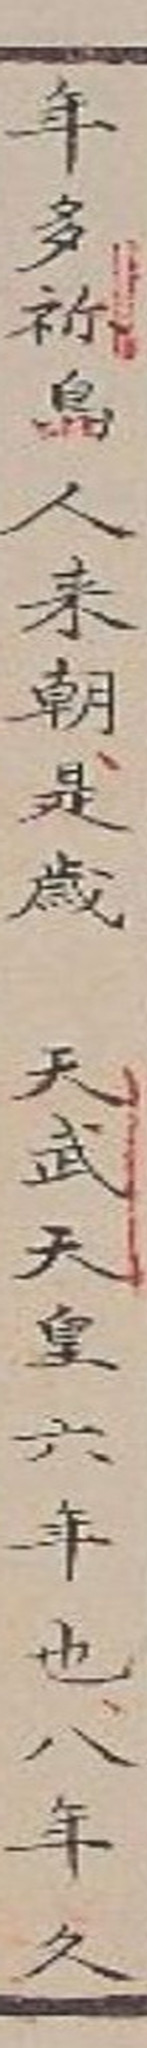年多禰島人来朝、是歳天武天皇六年也、八年久
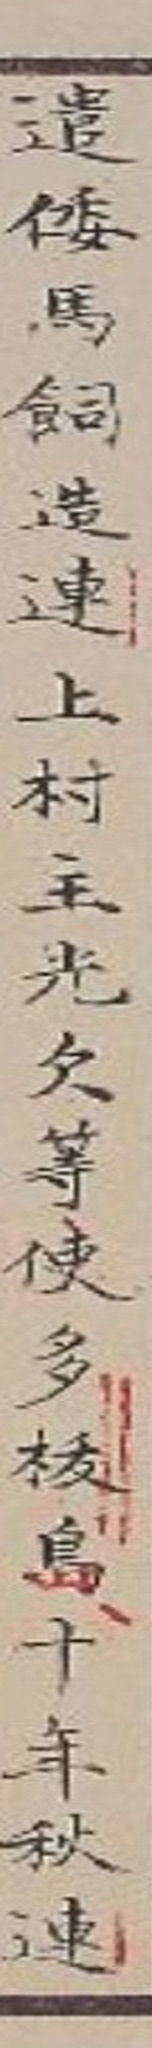遣倭馬飼造連上村主光欠等使多島、十年秋連
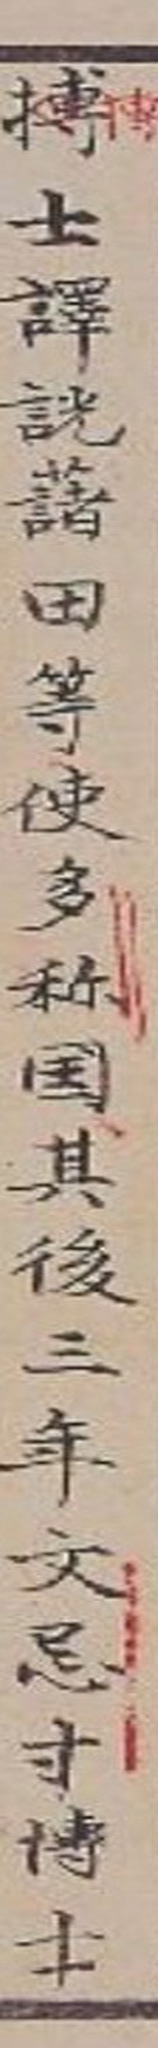搏博士訳藷田等使多禰国、其後三年文忌寸博士

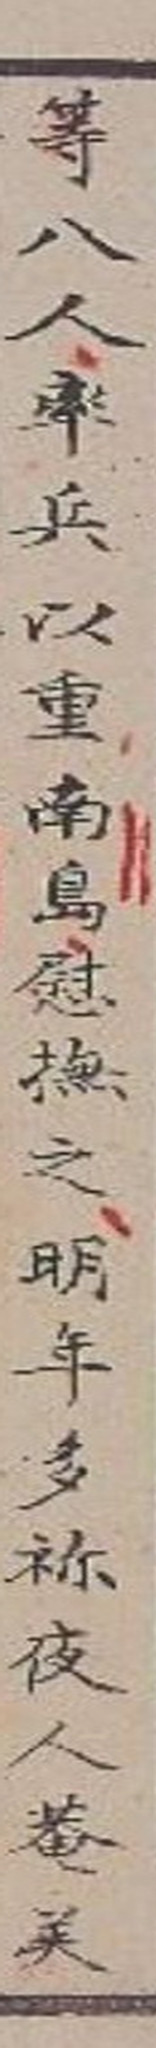等八人、率兵以重南島、慰撫之、明年多禰夜人菴美
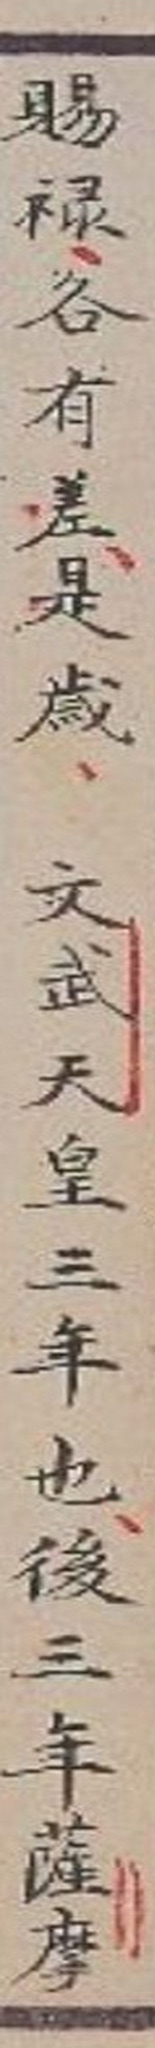賜禄、各有差、是歳、文武天皇三年也、後三年薩摩
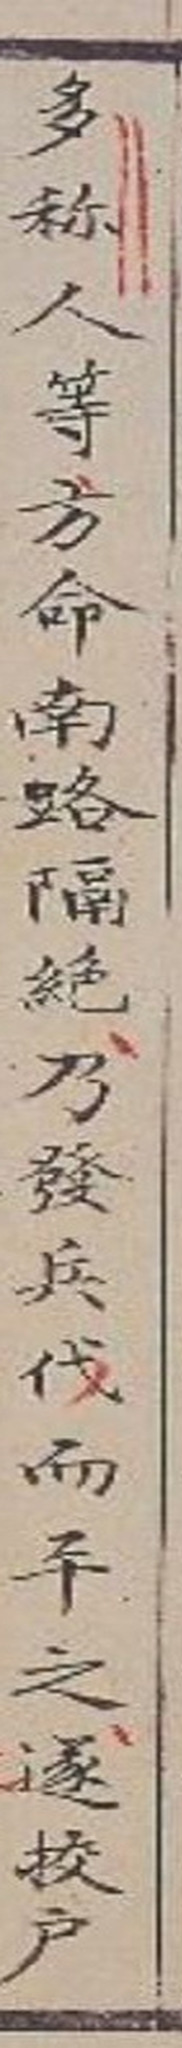多禰人等方命南路隔絕、乃発兵伐而平之、遂挍戸
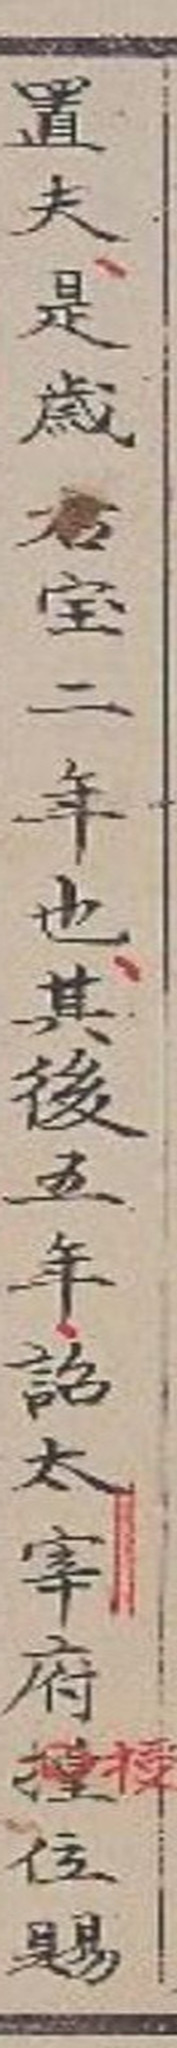置夫、是歳右宝二年也、其後五年、詔太宰府揘授位賜
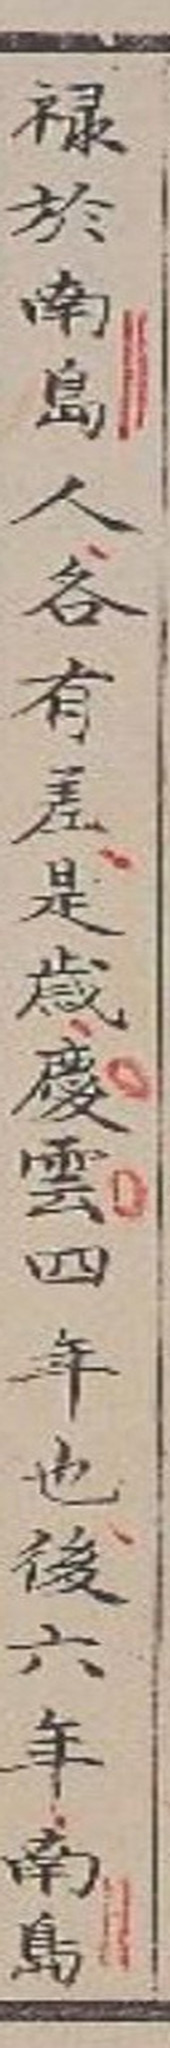禄於南島人、各有差、是歳、慶雲四年也、後六年、南島
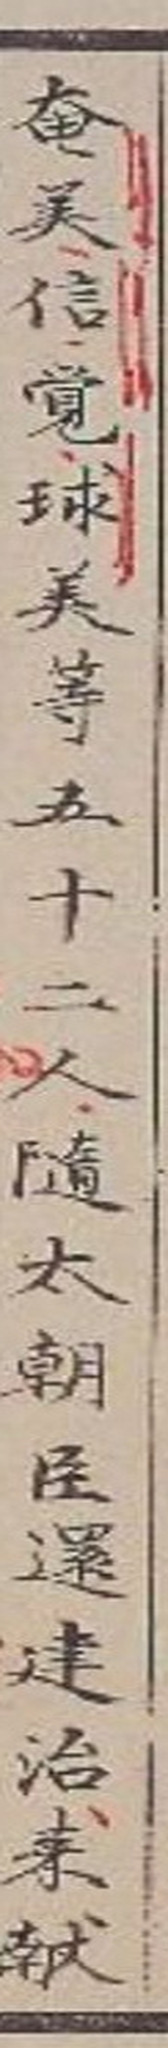奄美、信、覚、球美等五十二人、隨太朝臣還建治、来献
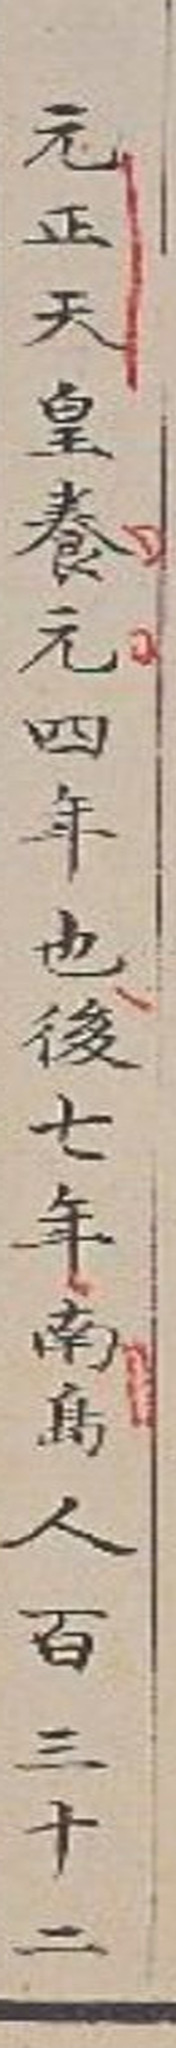元正天皇養元四年也、後七年、南島人百三十二
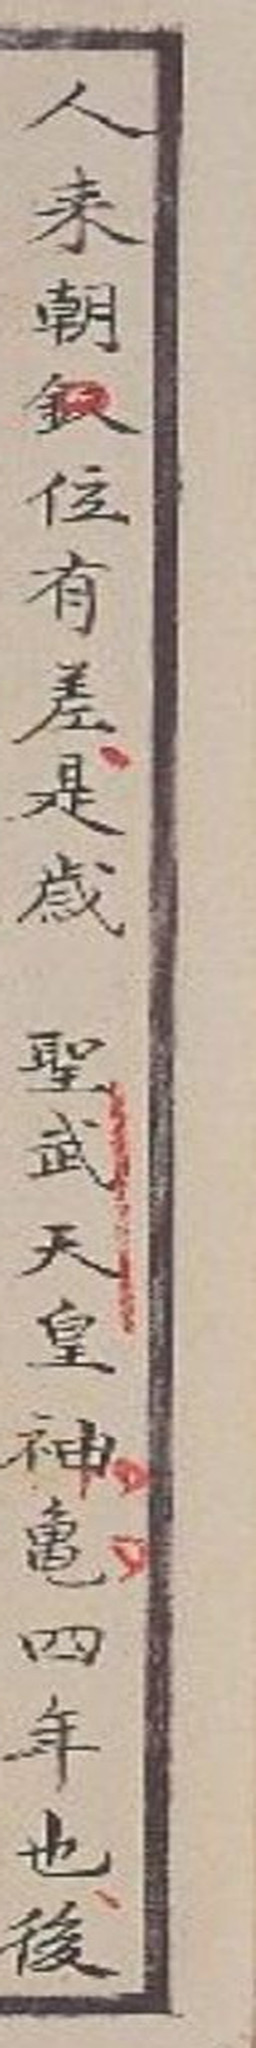人来朝釵叙位有差、是歳聖武天皇神亀四年也、後
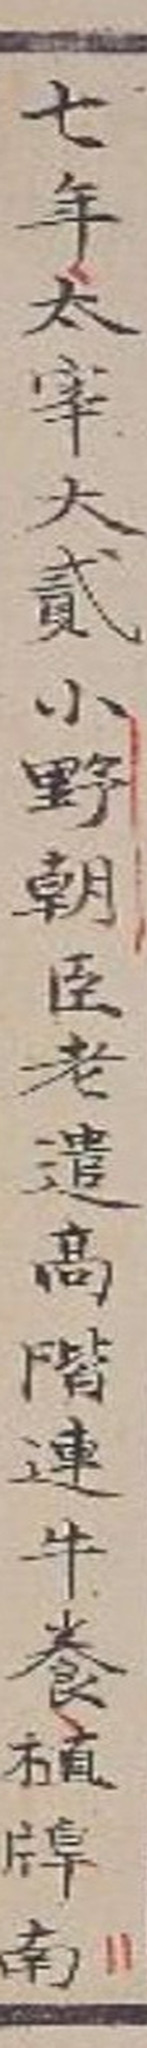七年、太宰大貳小野朝臣老遣高階連牛養植牌南
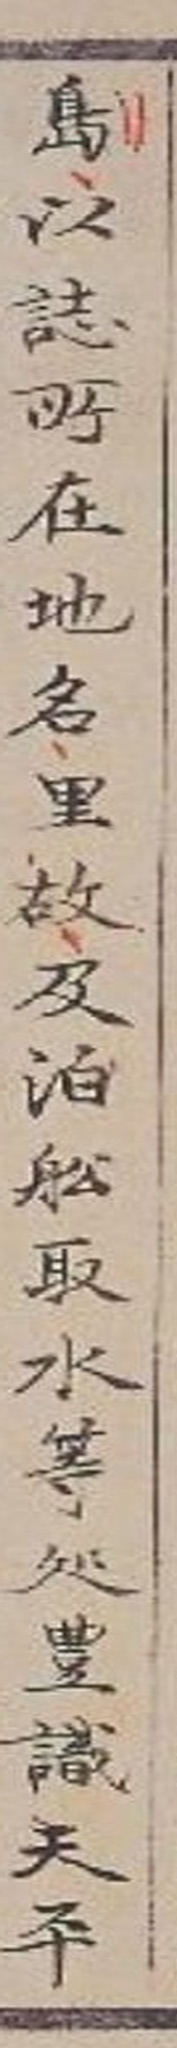島、以誌所在地名、里故、及泊船取水等処豊識天平
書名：南島志 全
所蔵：University of the Ryukyus Library
